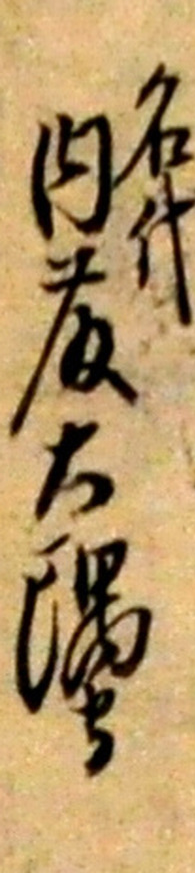内藤大和守
